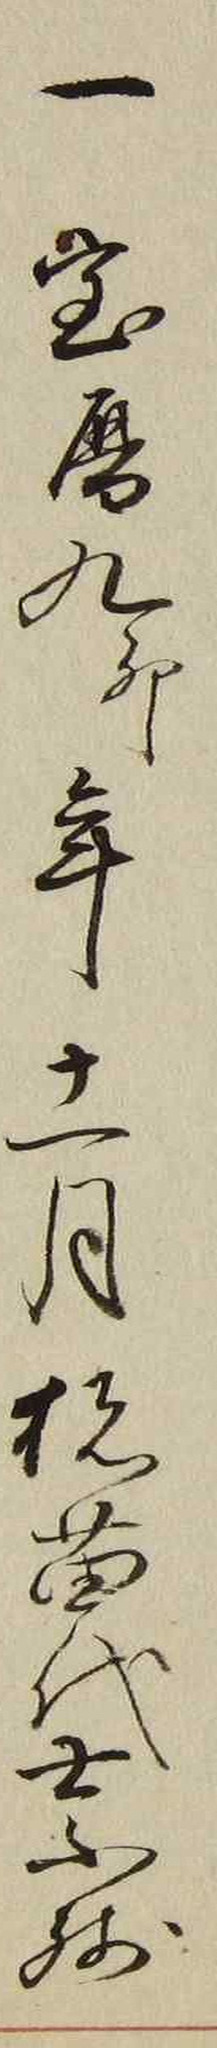一宝暦九卯年十一月猪苗代士不残
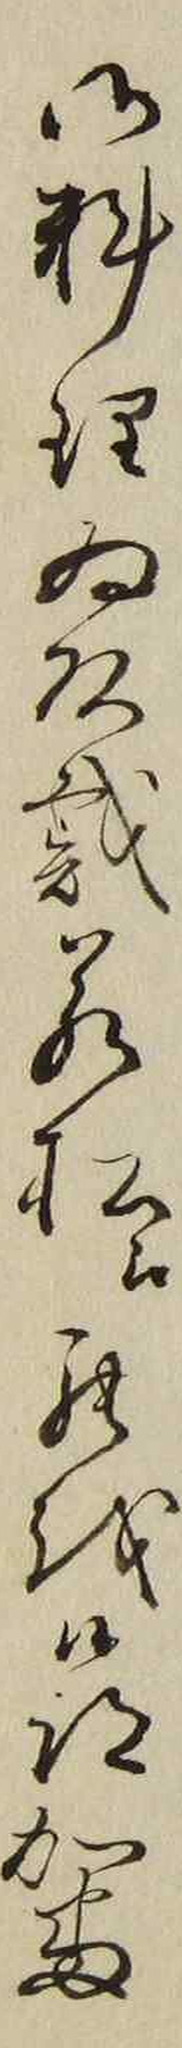御料理為頂戴若松江罷越候跡加番

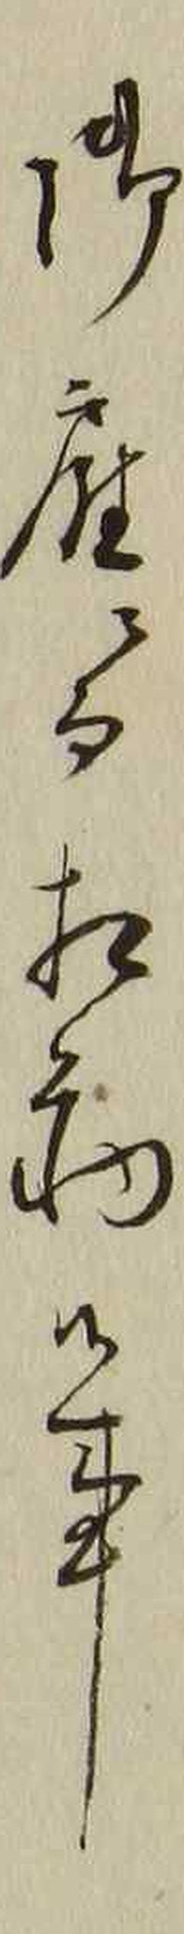御雇に而相勤候事
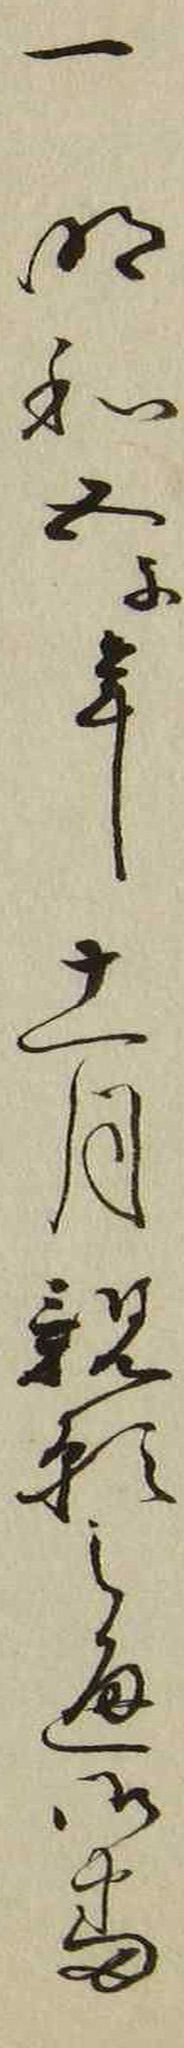一明和五子年十一月親願の通御番
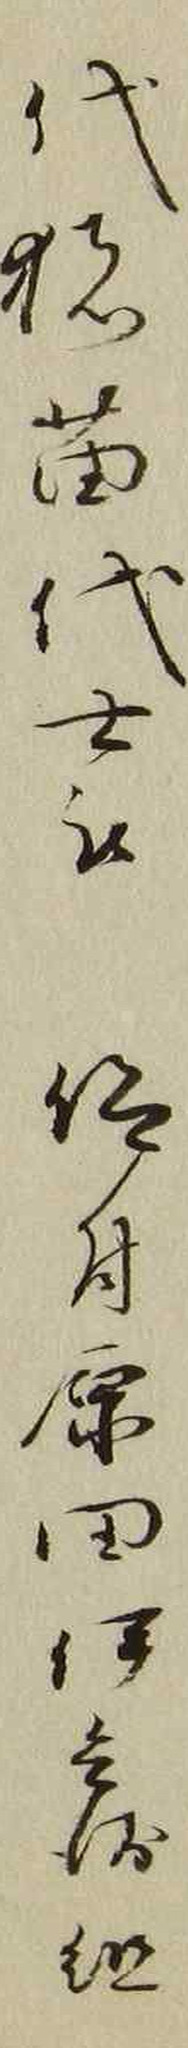代猪苗代士被仰付原田伊兵衛組
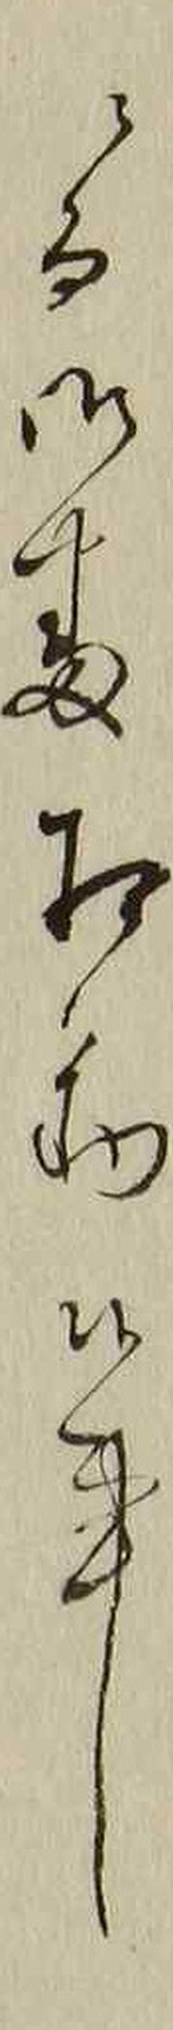に而御番相勤候事
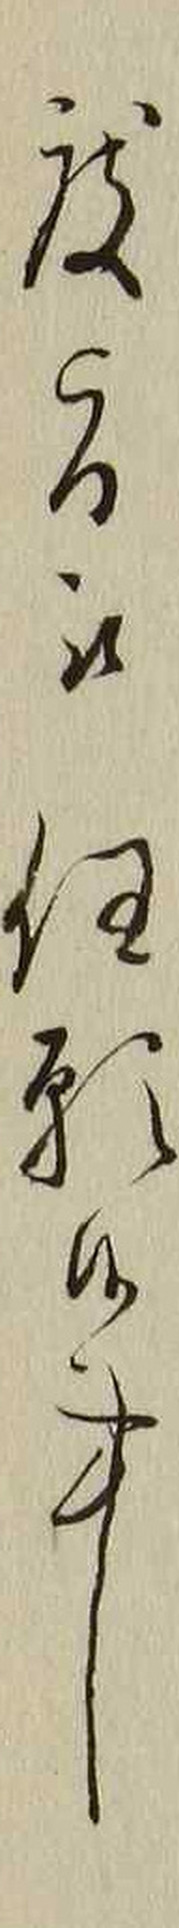度旨被任願候事
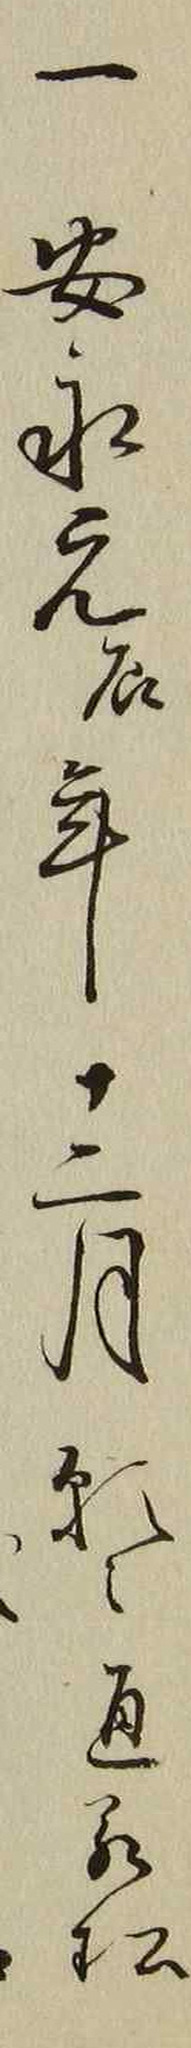一安永元辰年十二月願の通若松
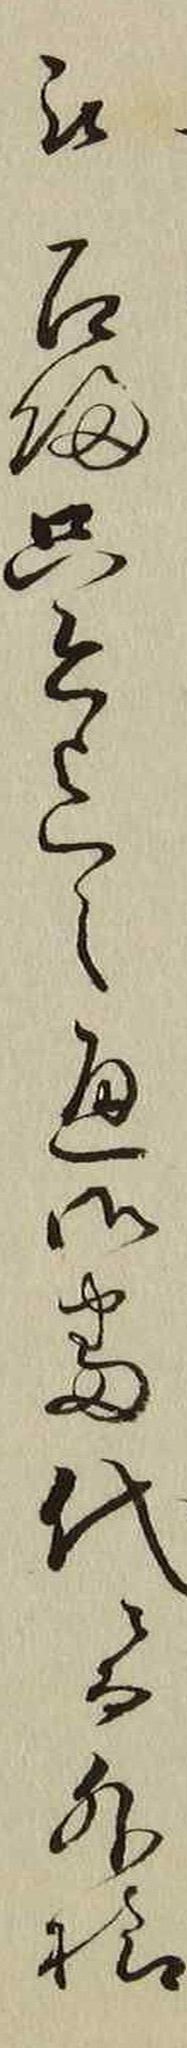被召帰只今迄の通御番代に而外様
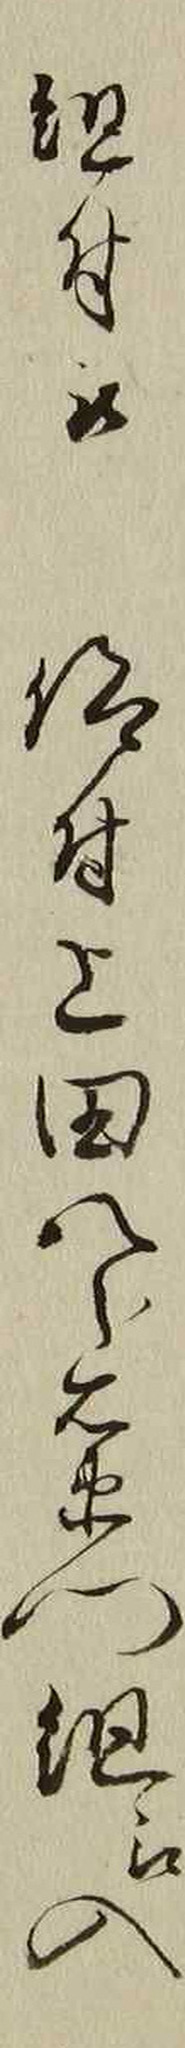組付被仰付上田八郎右衛門組江入
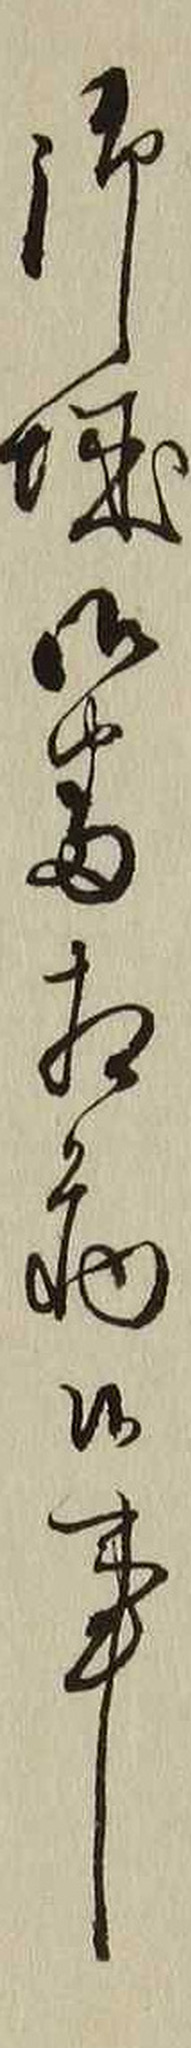御城御番相勤候事
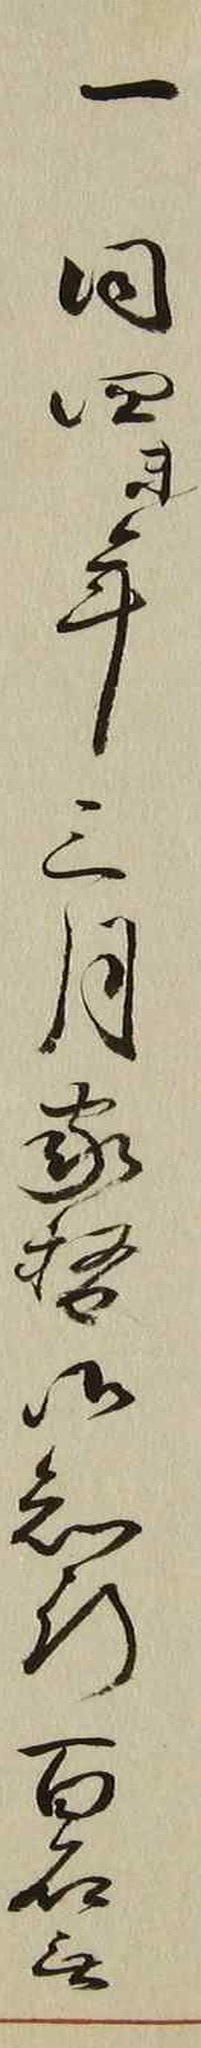一同四未年三月家督御知行百石無
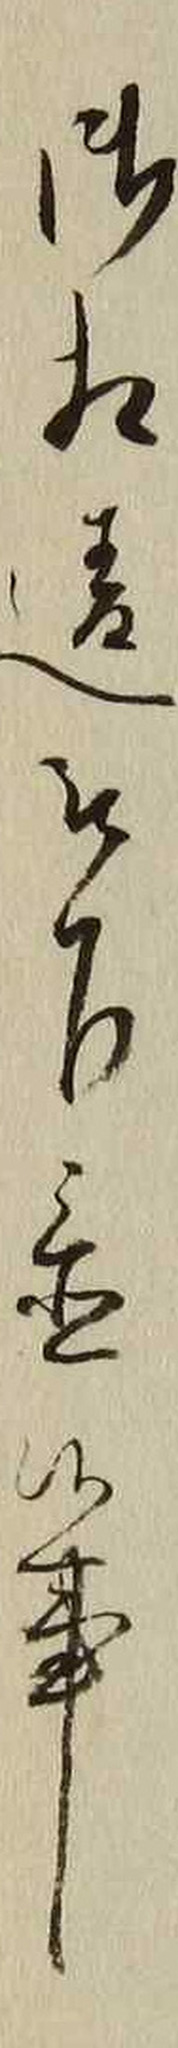御相違被下置候事
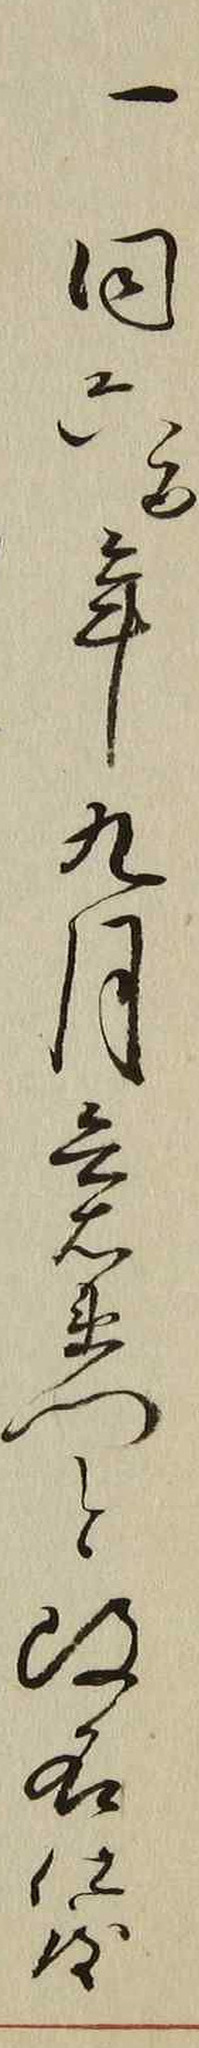一同六酉年九月兵右衛門と改名仕度
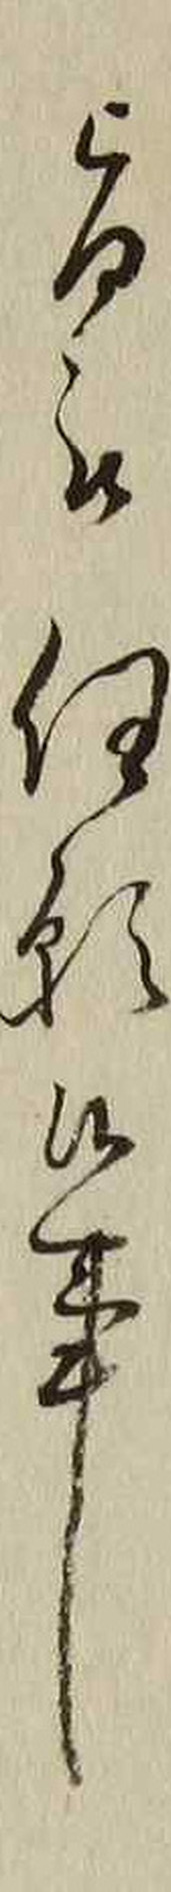旨被任願候事
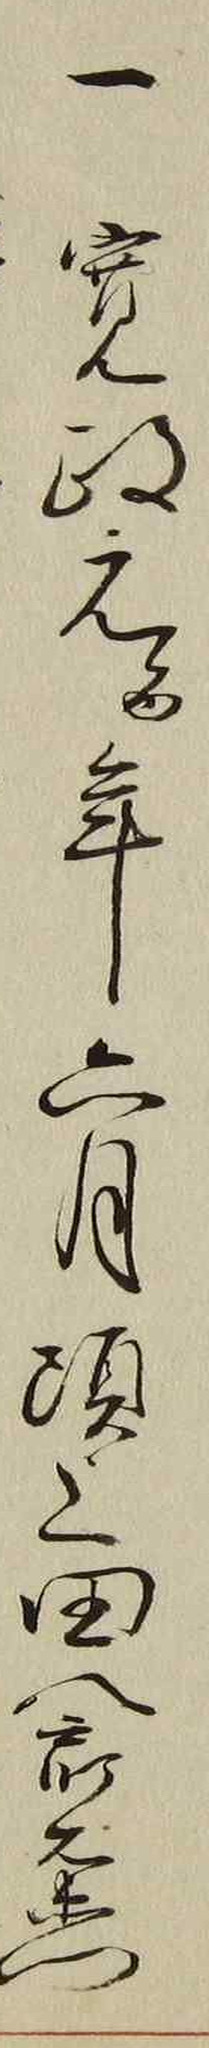一寛政元酉年六月頭上田八郎右衛門
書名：諸士系譜　巻之1　い之部1
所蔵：会津若松市立会津図書館
